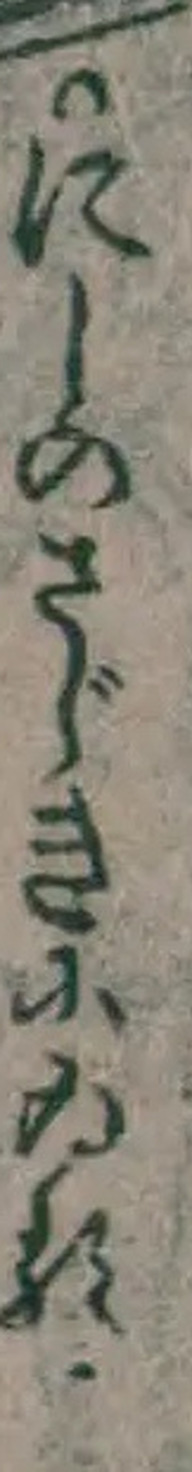○にしのさじきにゐる
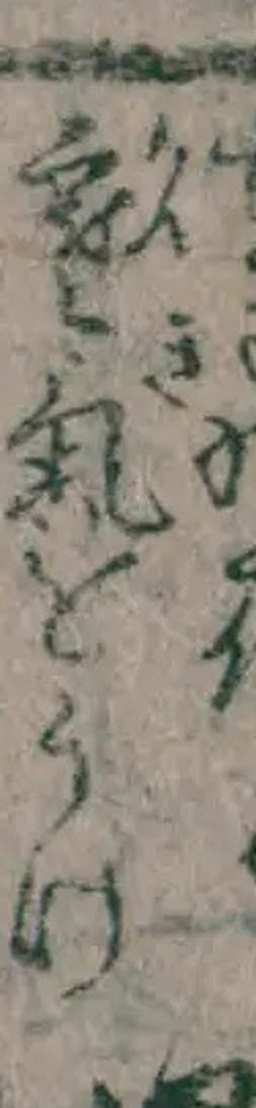寒気をうけ
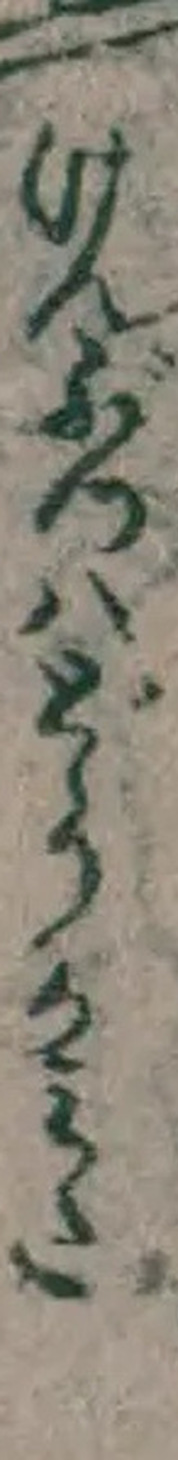けんぶつはどうかみた
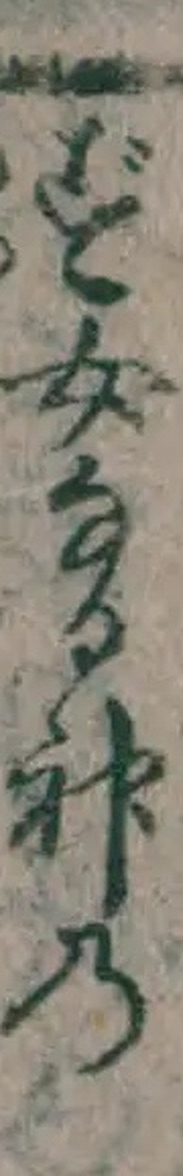ず女なる神の
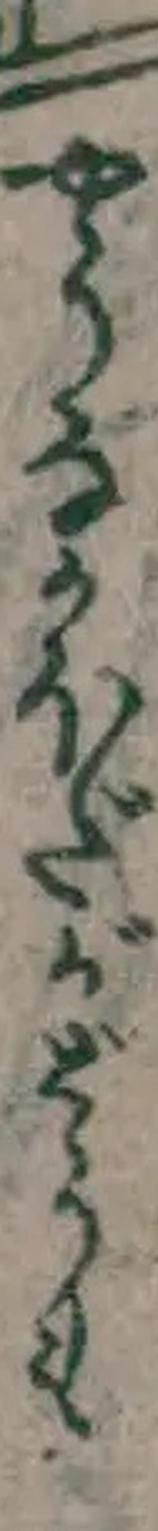やうなかほだがどうも
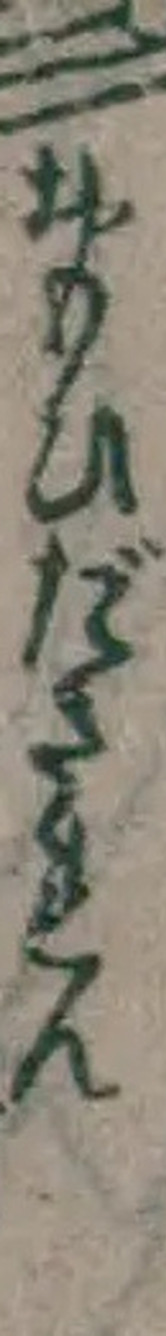おもひだされん
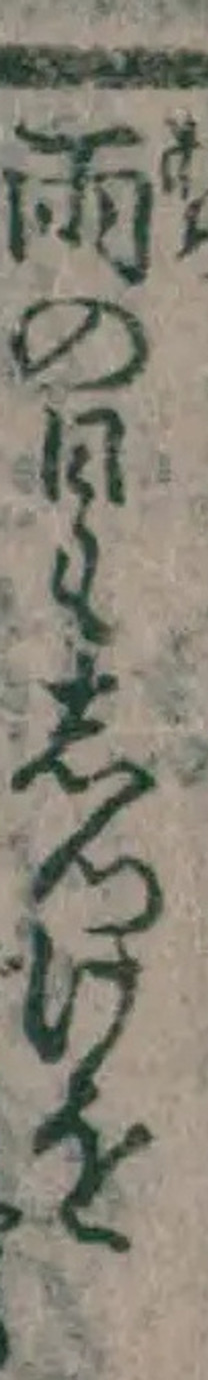雨の日もしつけを
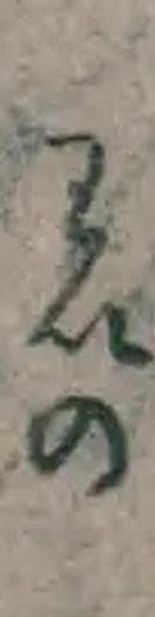わいの
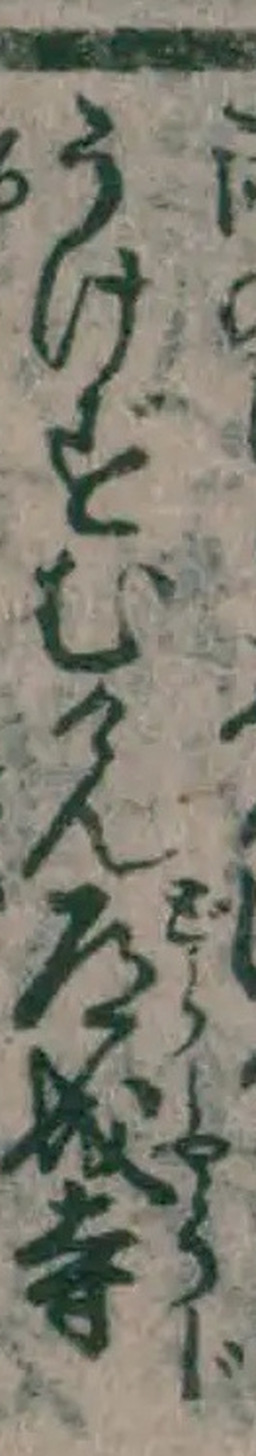うけずむけん道成寺
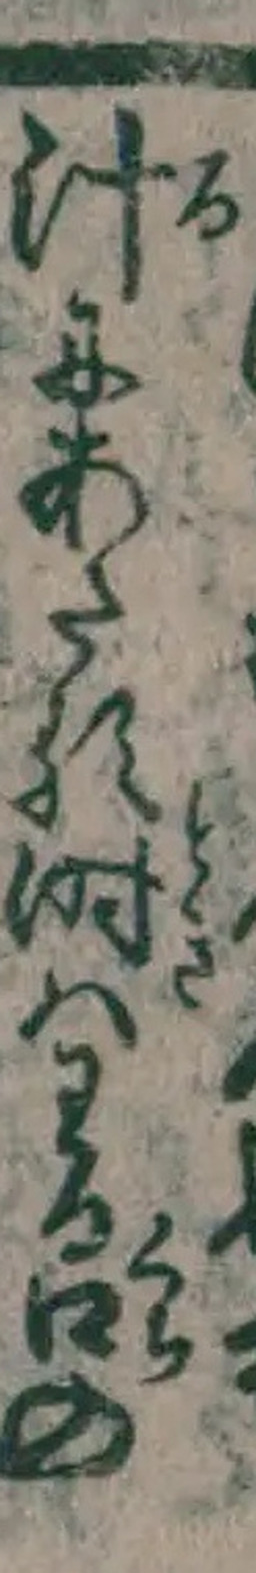汁にあたる時はわる口の
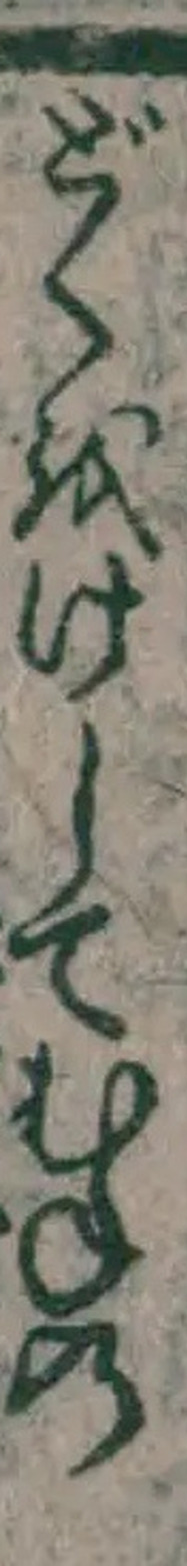どくをけしてむねの
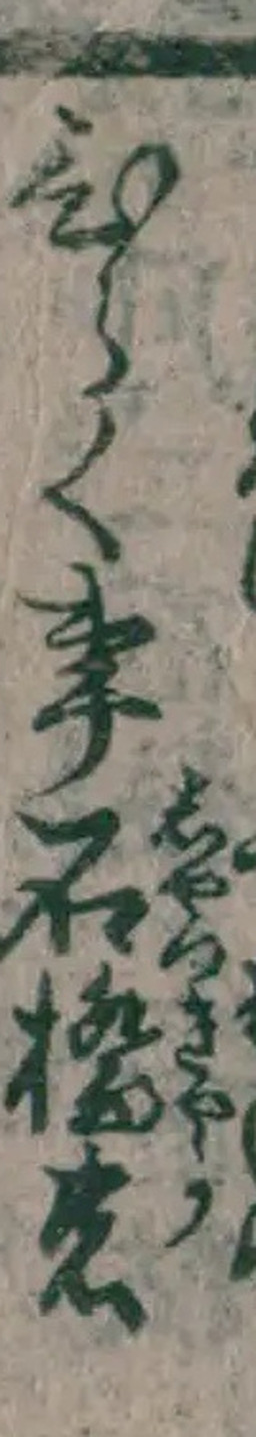ひらく事石橋の
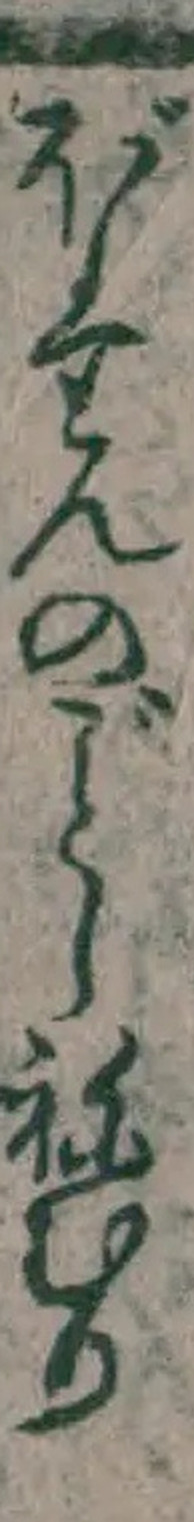ぼたんのごとしねむり
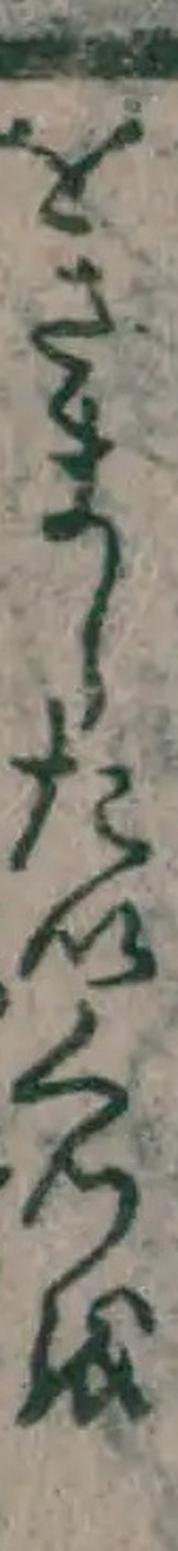をさましたいくつを
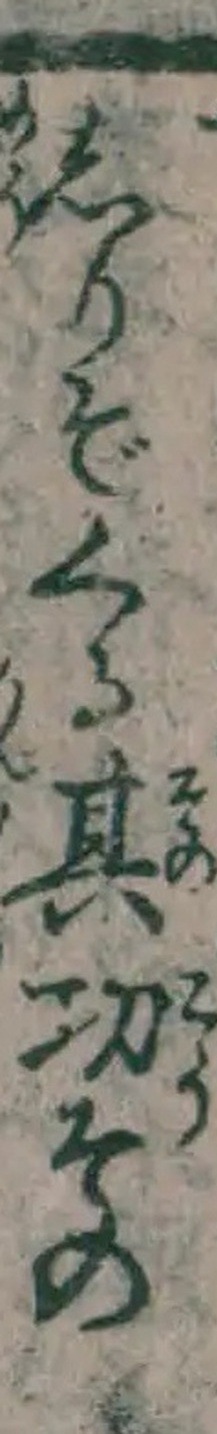しりぞくる其功その
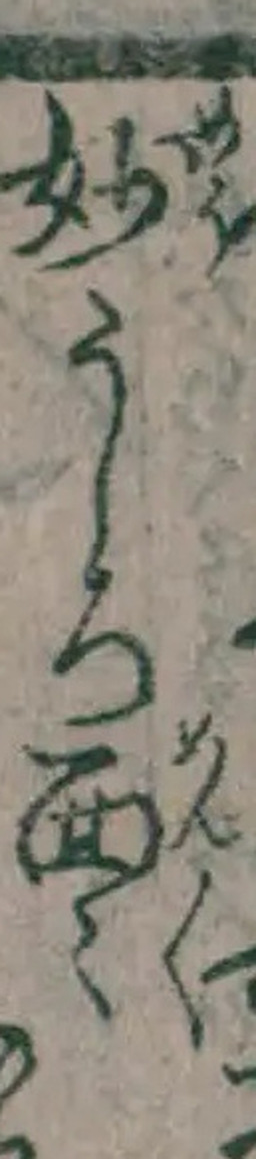妙うしろ面々
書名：視薬霞報条 3巻
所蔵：国立国会図書館 National Diet Library, JAPAN
